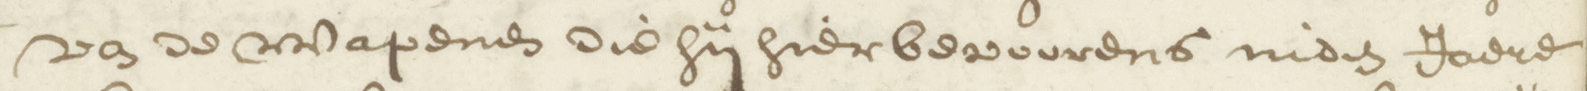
van de wapenen die hij hier bevoorens inden Jaere
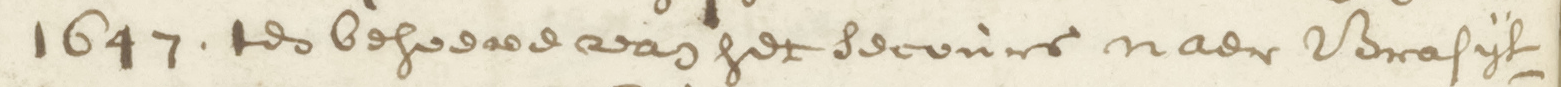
1647. ten behoeve van het secours naer Brasijl
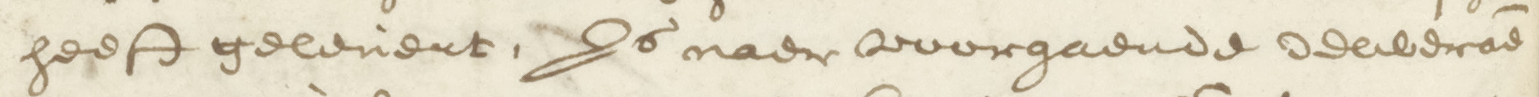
heeft gelevert, Is naer voorgaende deliberae
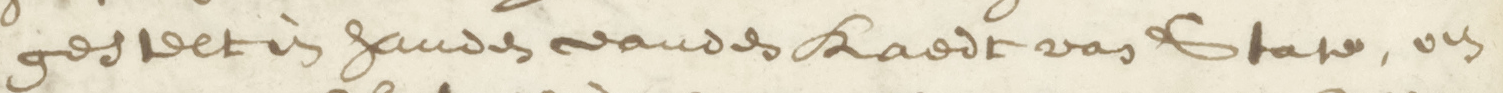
gestelt in handen vanden Raedt van State, om
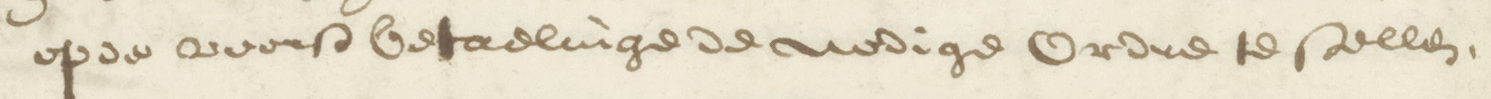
opde voors betaelinge de nodige Ordre te stellen.
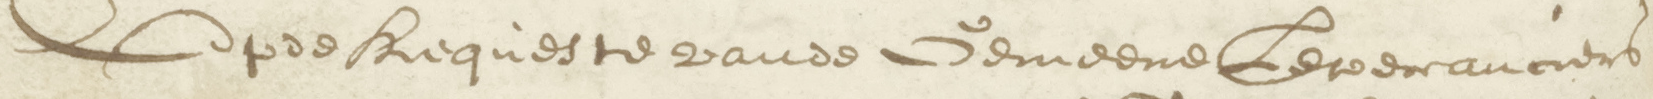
Opde Requeste vande Gemeene Leveranciers
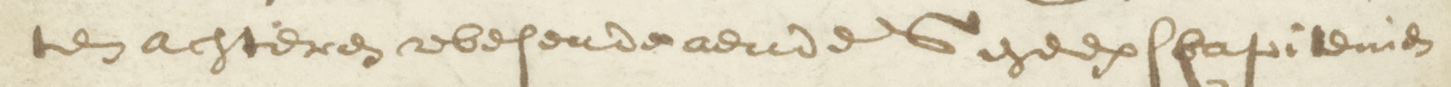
ten achteren wesende aende Scheepscapiteinen
